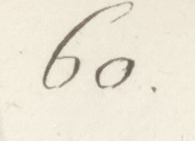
60.
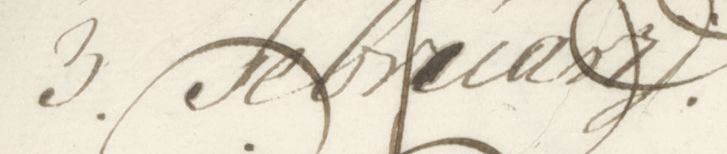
3. February.
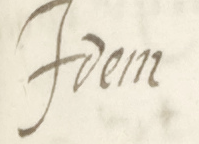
Idem
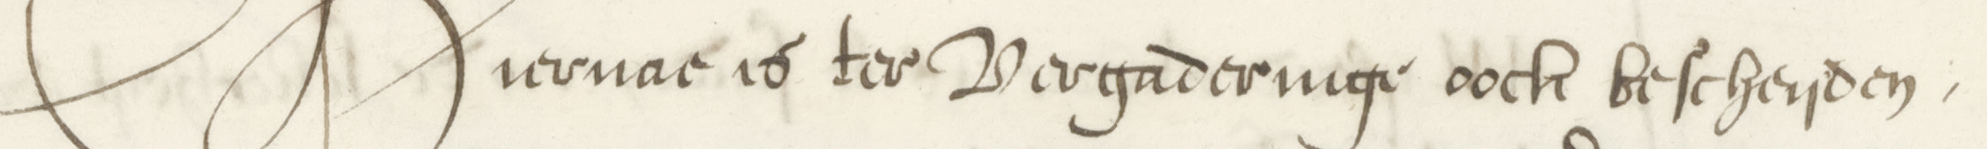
Hiernae is ter Vergaderinge oock bescheyden,
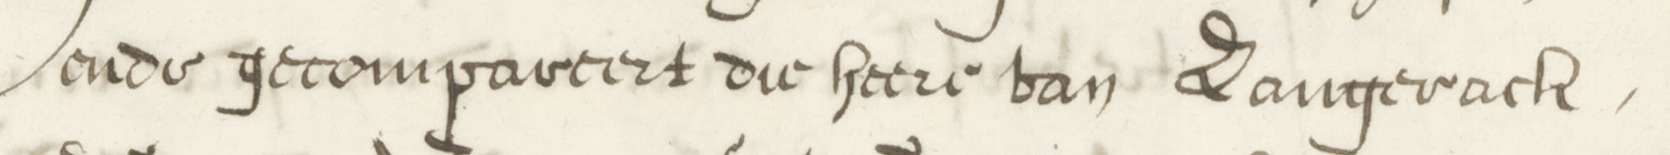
ende gecompareert die heere van Langerack.
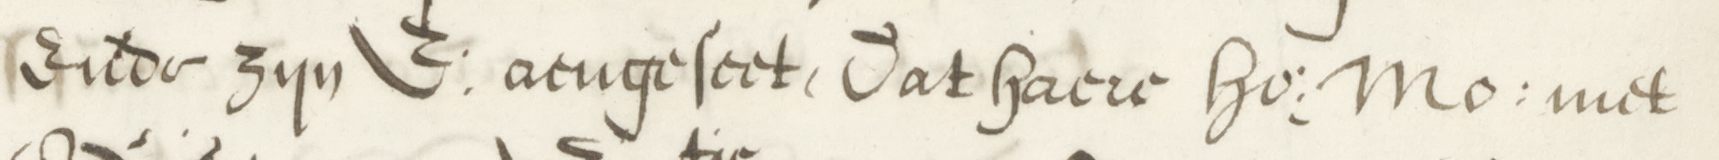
Ende zyn E. aengeseet, dat haere Ho:Mo: met
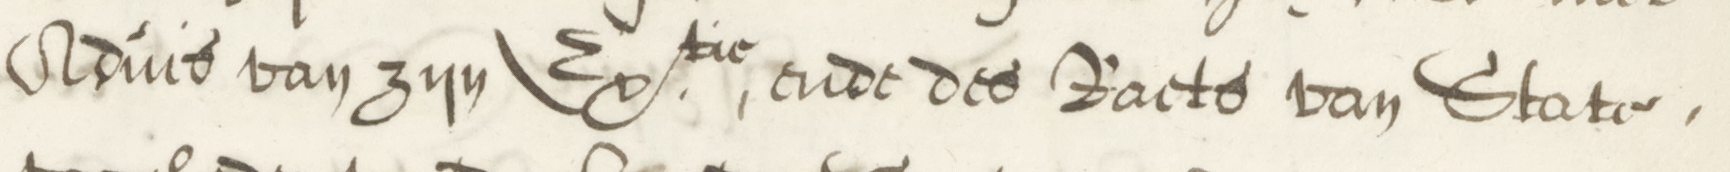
Aduis van zijn Extie., ende des Raets van State,
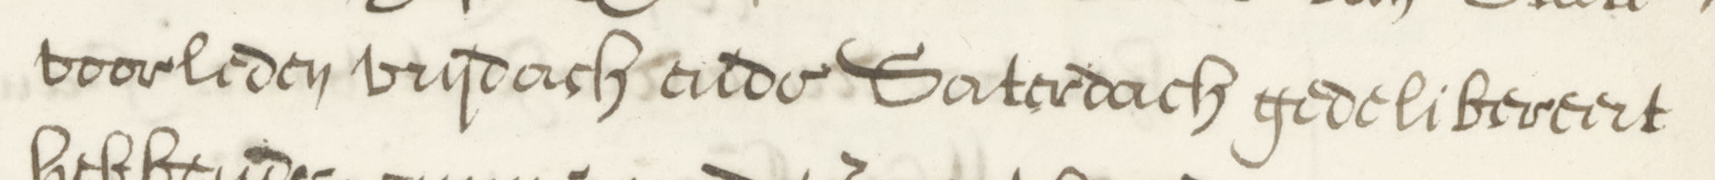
voorleden vrydach ende Saterdach gedelibereert
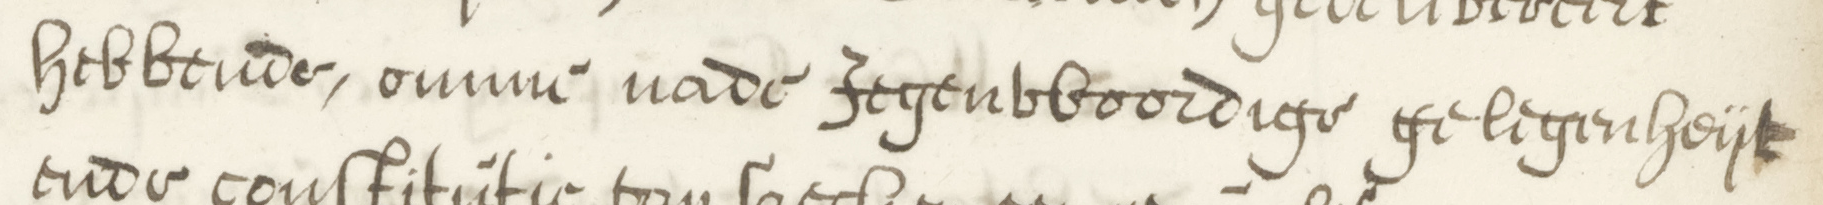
hebbende, omme nade Jegenwoordige gelegenheijt
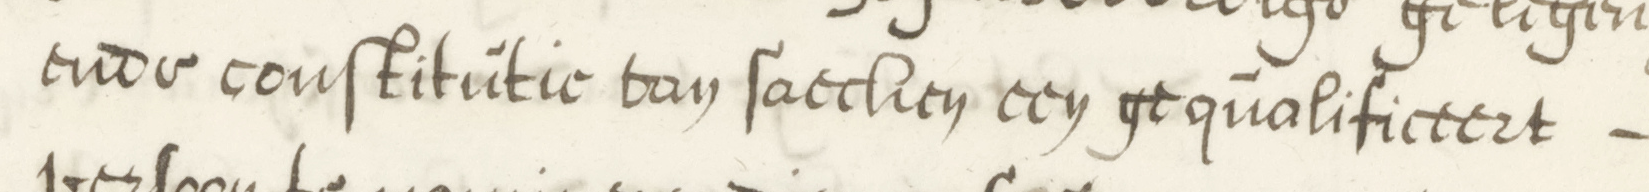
ende constitutie van saecken een gequalificeert
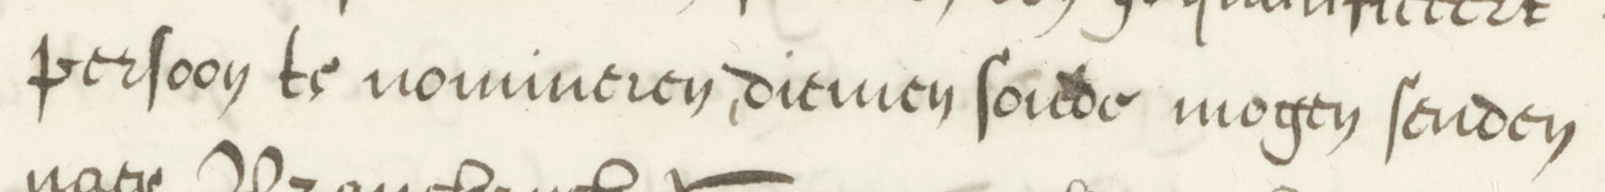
persoon te nomineren, diemen soude mogen senden
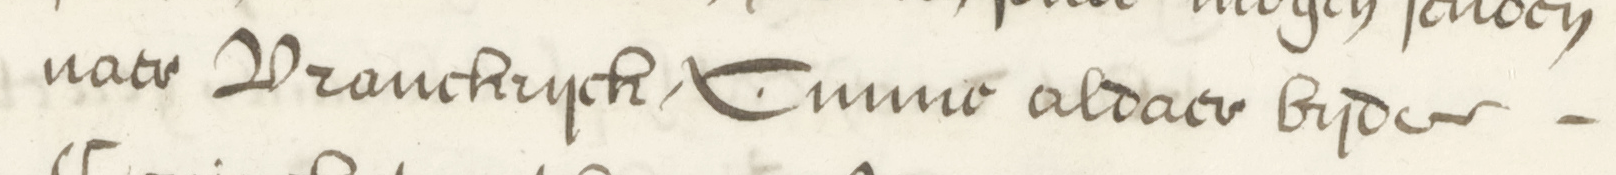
naer Vranckryck, Omme aldaer byden
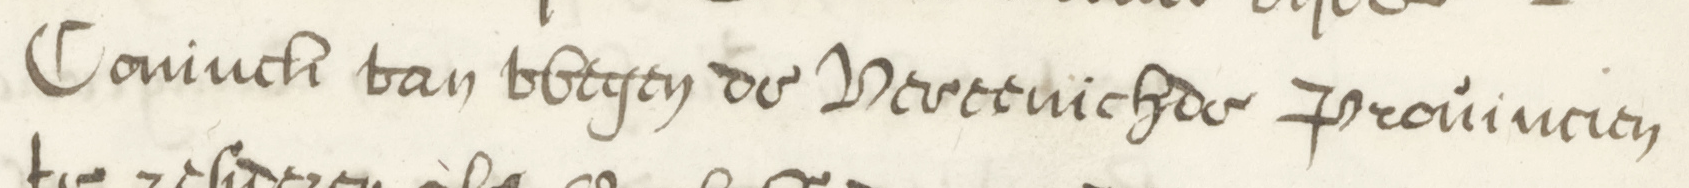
Coninck van wegen de Vereenichde Prouincien
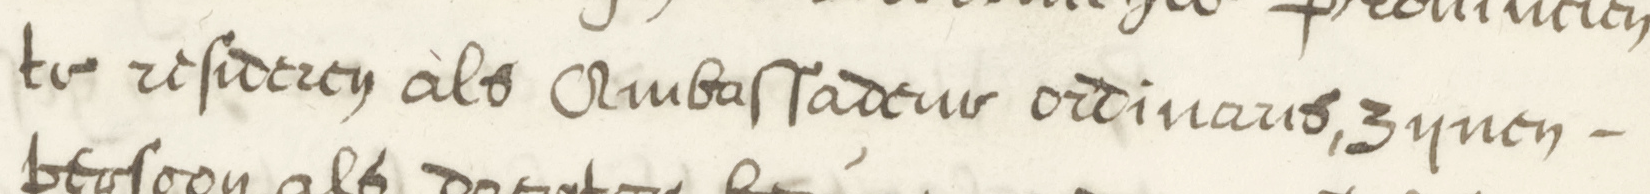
te resideren als Ambassadeur ordinaris, zynen -
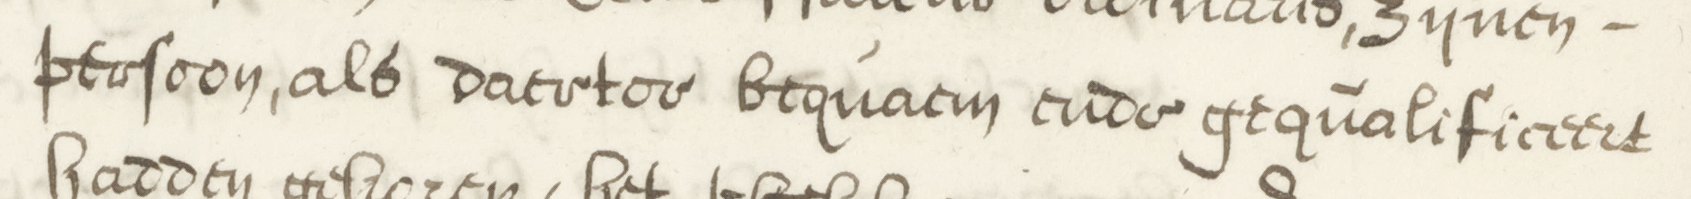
persoon, als daertoe bequaem ende gequalificeert
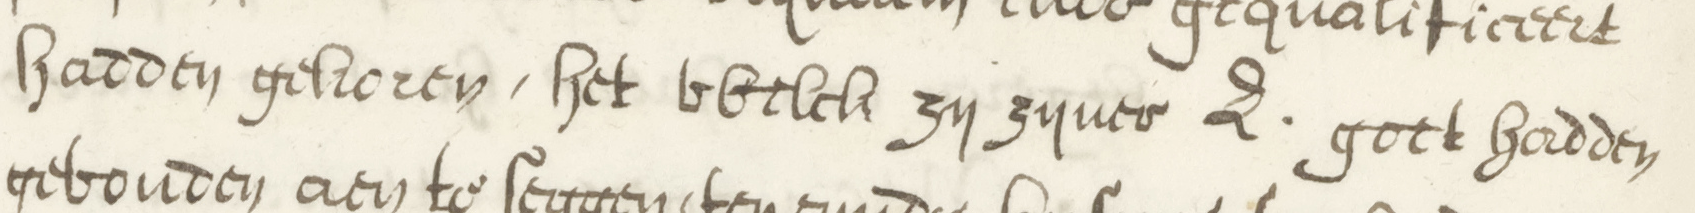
hadden gehoren, het welck zy zyner E. goet hadden
